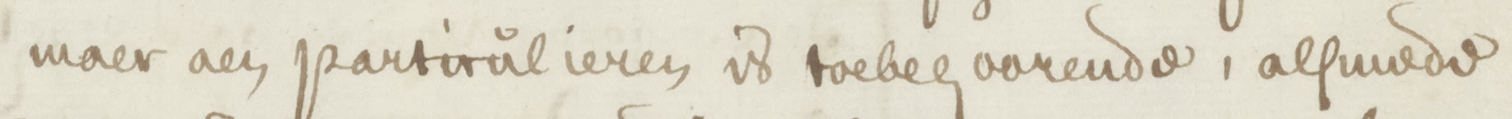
maer aen particulieren is toebehoorende, alsmede
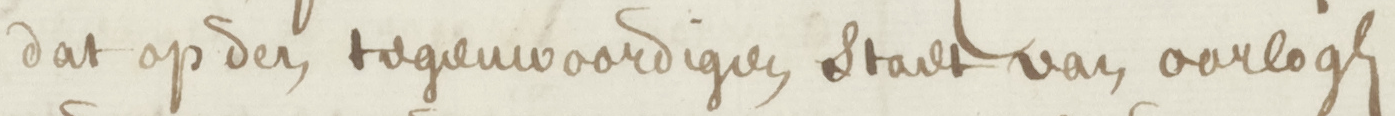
dat op den tegenwoordigen Staet van oorlogh
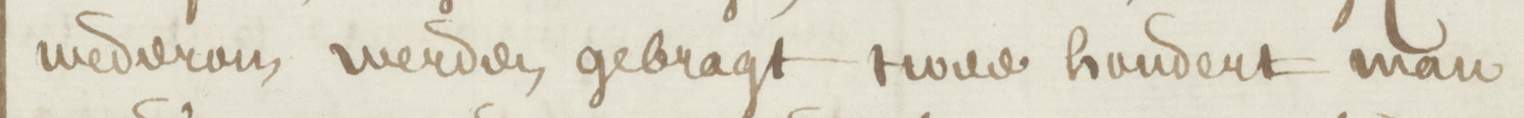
wederom werden gebragt twee hondert man
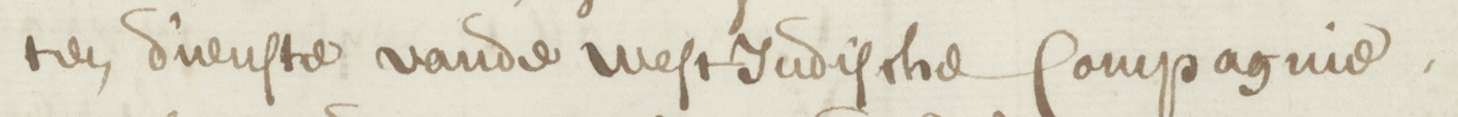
ten dienste vande westIndische Compagnie,
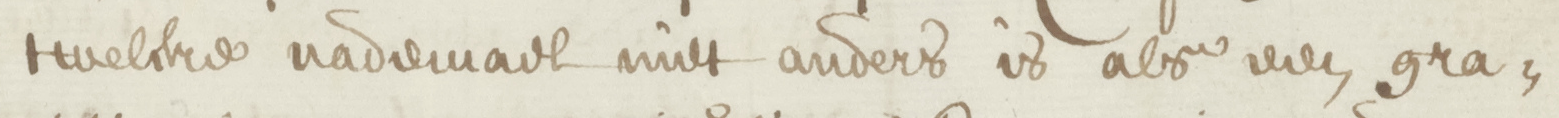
twelcke nademael niet anders is als een gra„
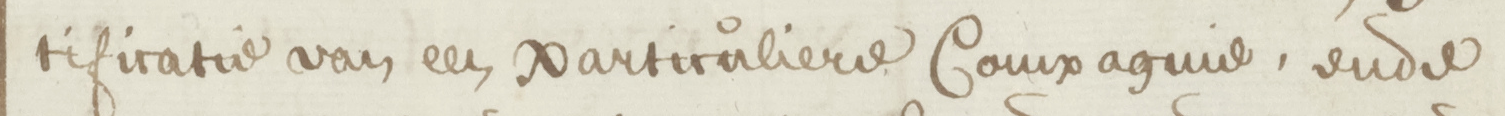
tificatie van een Particuliere Compagnie, ende
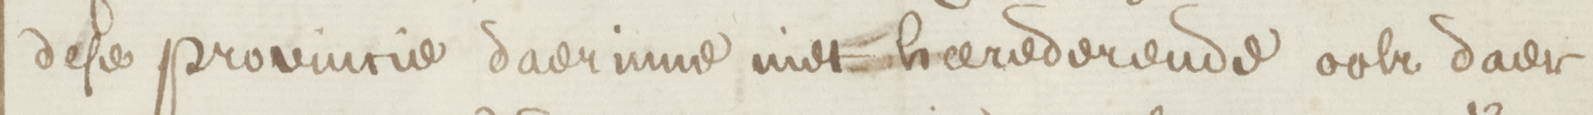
dese provincie daerinne niet heerederende ook daer
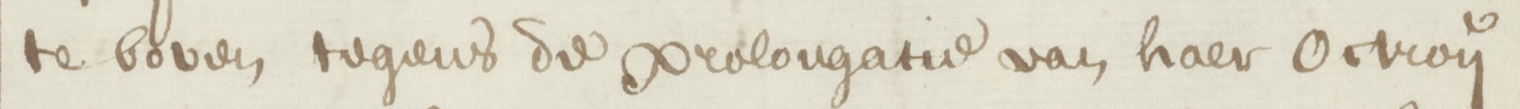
te boven tegens de prolongatie van haer Octroij
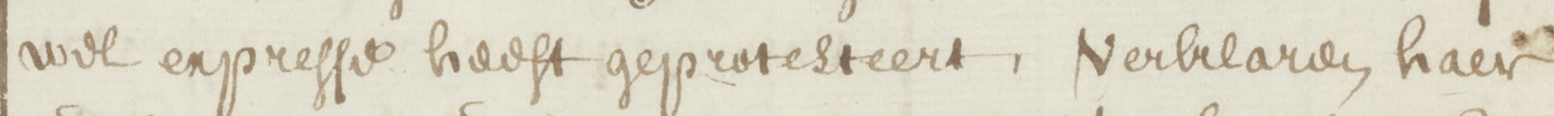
wel expresse heeft geprotesteert, Verklaren haer
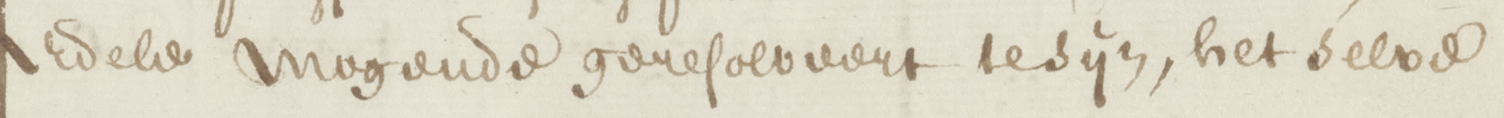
Edele mogende geresolveert te sijn, het selve
